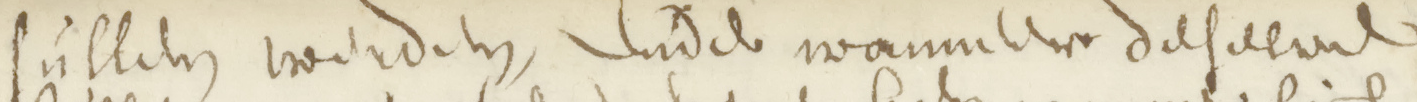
sullen werden, ende wanneer deselve
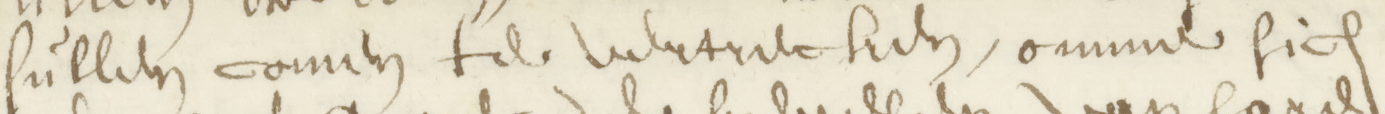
sullen comen te vertrecken, omme sich
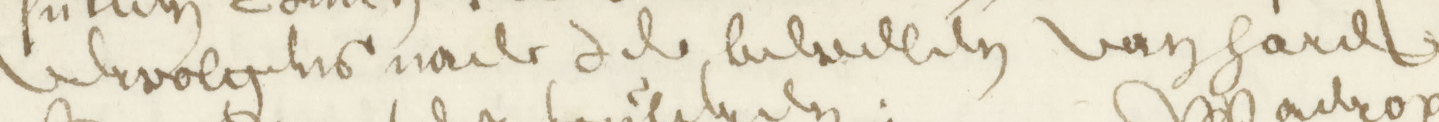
vervolgens nae de bevelen van hare
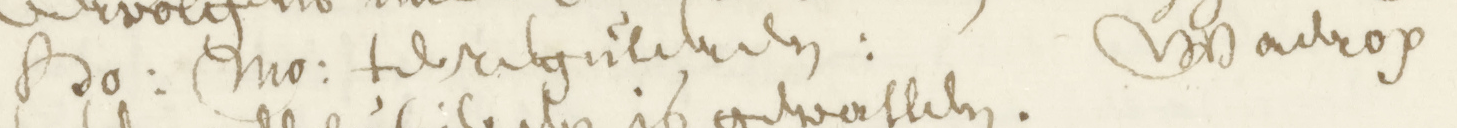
Ho:Mo: te reguleren: Waerop
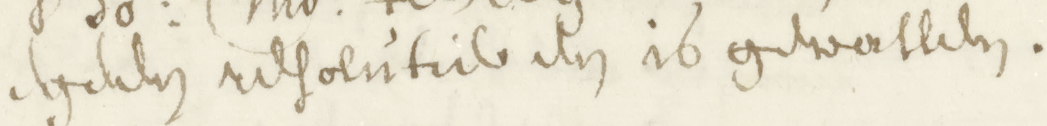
egeen resolutie en is gevallen.
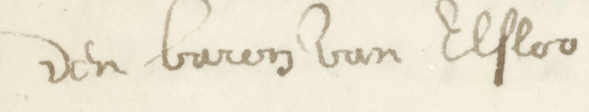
den baron van Elsloo
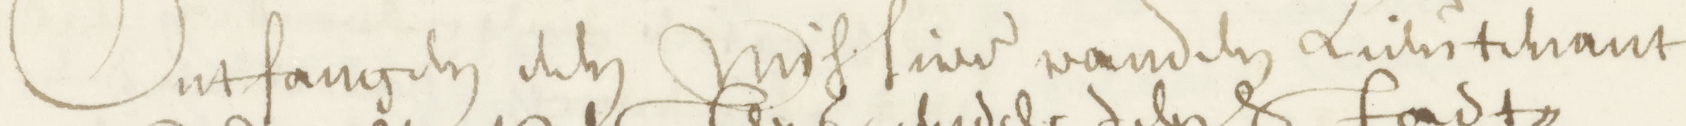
Ontfangen een Missive vanden Lieutenant
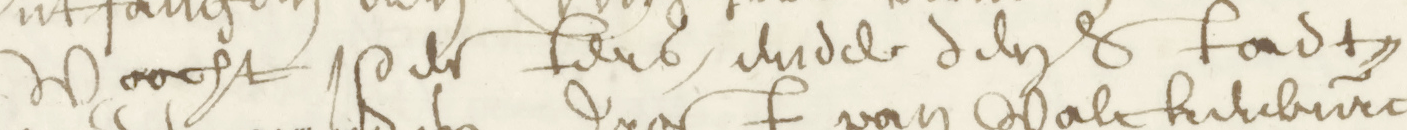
Voocht Pesters, ende den Stadt„
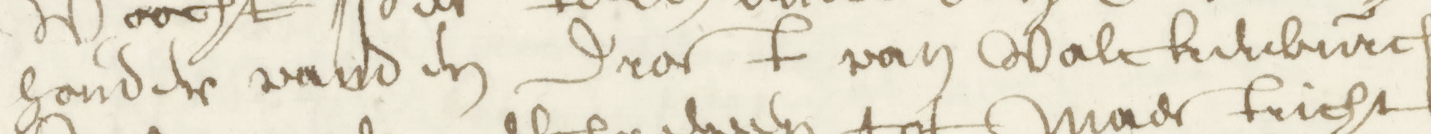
houder vanden Drost van Valckenburch,
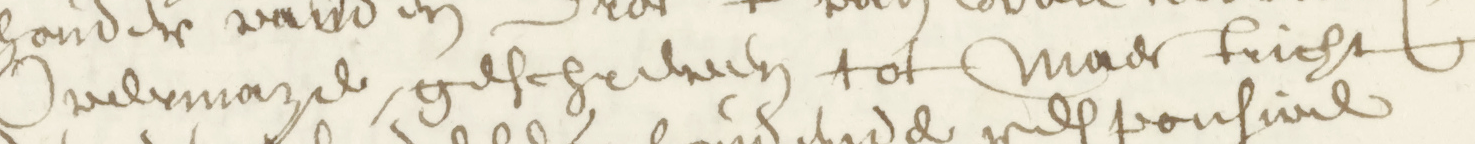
Overmaze, geschreven tot Maestricht
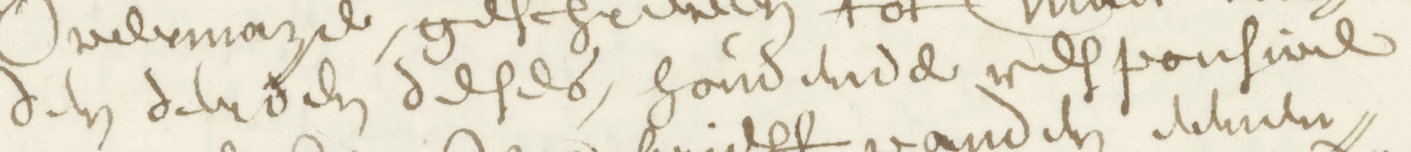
den derden deses, houdende responsive
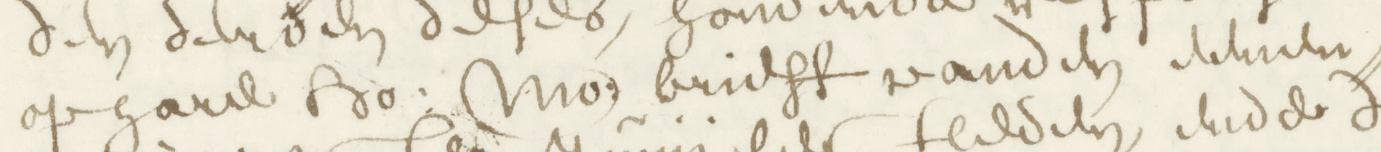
op hare Ho:Mo: brieff vanden eenen„
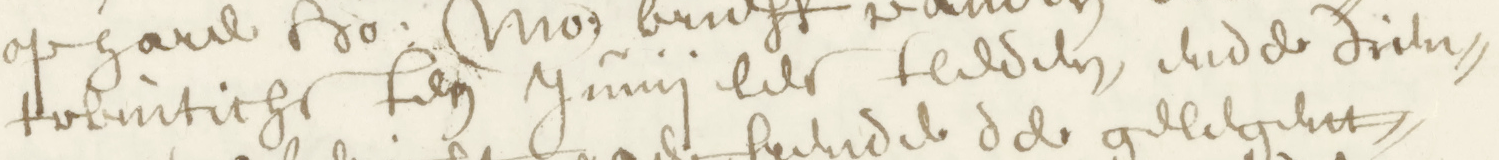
twintichsten Junij lestleden, ende dien„
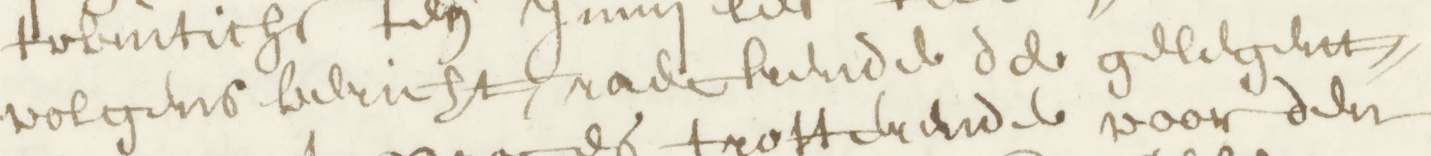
volgens bericht, raeckende de gelegent„
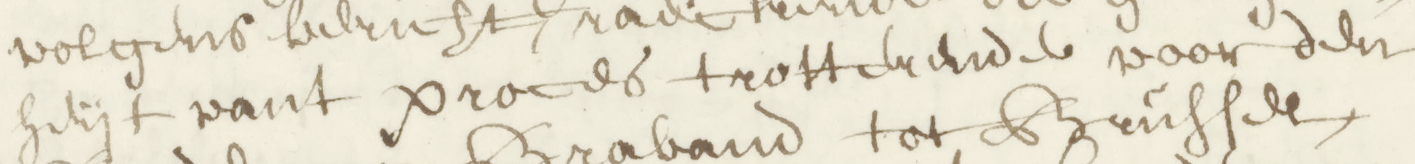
heijt vant proces trotterende voor den
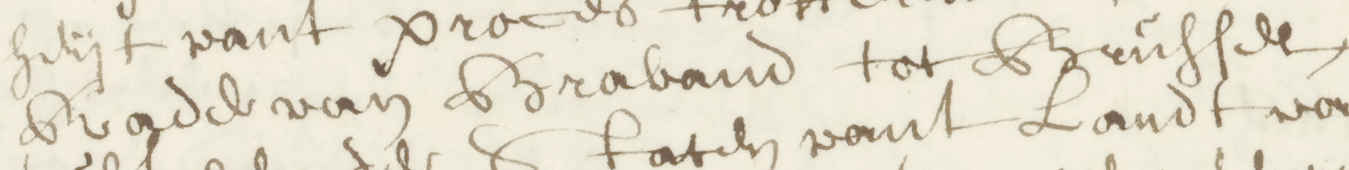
Rade van Braband tot Brussel,
